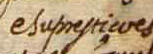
e suprestiçoes
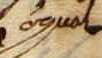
o qual
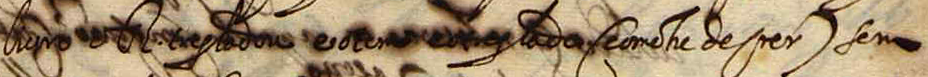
liuro o R. tresladou e o tem e o treslado (como he de crer) sem
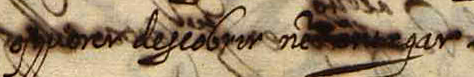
os querer descobrir nē entregar
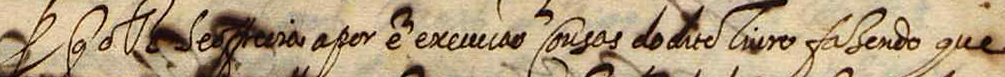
Ꝓ q̄ o R. Se offrecia a por ē execuçaõ Cousas do dito liuro fazendo que
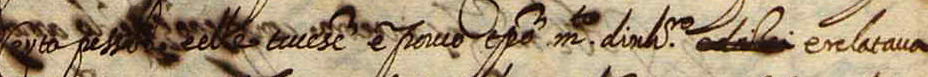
Certa pessoa e elle tiuesē ē pouco tpō m.to dinh.ro e dizia e relataua
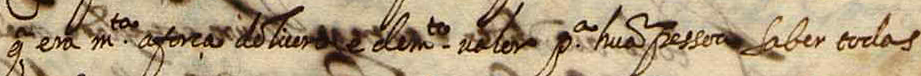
q̄ era m.ta a força do liuro e de m.to ualor p.a huā pessoa saber todas
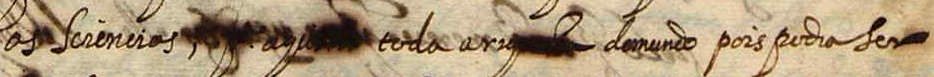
as Sciencias, p.a aquirir toda a riqueza do mundo pois podia ser
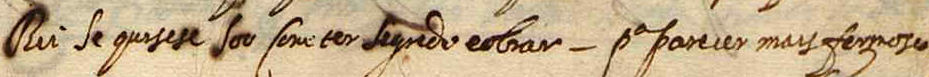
Rei se quisese soo Com ter segredo e obrar – pa parecer mais fermoso
